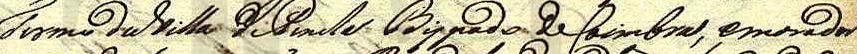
Termo da Villa de Penela Bispado de Coimbra, e morador
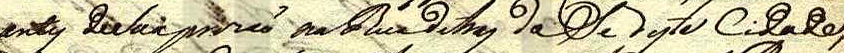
antes de sua prizaõ na Rua detras da Se deste Cidade,
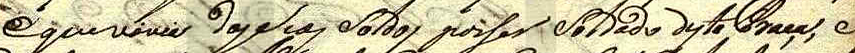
e que vivia dos seos soldos por ser Soldado desta Praça, e
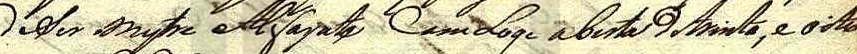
de Ser mestre Alfayate Com Loge aberta de trinta, e oito
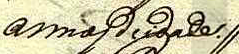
annos de idade.//
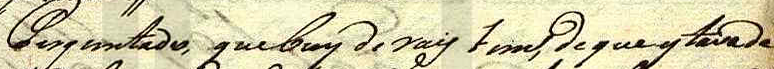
Perguntado, que bens de rais tem, de que estava de
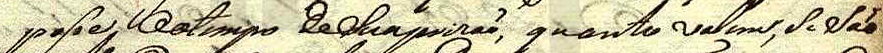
posses, ao tempo de Sua prizaõ, quanto valem, Se Saõ
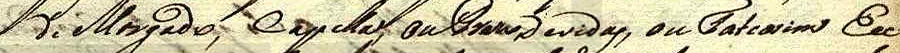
de Morgado, Capella, ou Prazo devidas, ou Fateosim Ecc
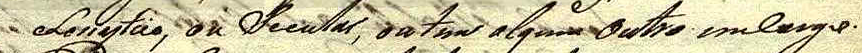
cLesastico, ou Secular, ou tem algum outro em cargo?
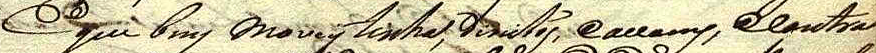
E que bens moveis tinha, direitos, e accoens, e contra
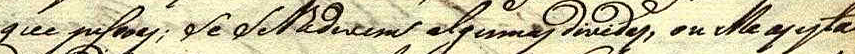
que pessoas; se se lhe devem algumas dividas, ou lhe as esta
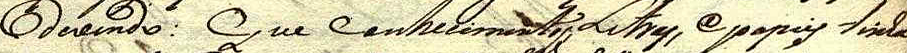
devendo: Que conhecimentos, Letras, e papeis tinha
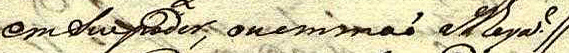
em Seu poder, ou em maõ alheya?//
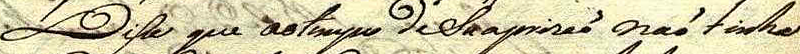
Disse que ao tempo de Sua prizaõ naõ tinha
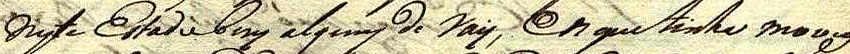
neste Estado bens alguns de rais, E os que tinha moveis
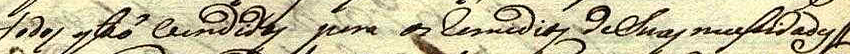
todos estaõ uendidos para os Remedios de Suas necessidades//
